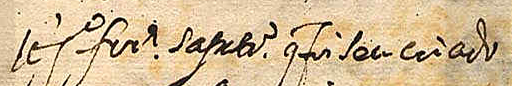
he jo fer.a sapat.ro. q̄ foi seu criado
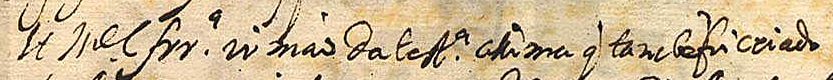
Item M.el frr.a irmaõ da test.a assima q̄ tambē foi criado
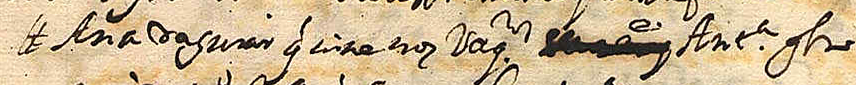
Item Ana daguiar q̄ esta nos Vaq.ros e Ant.a glz
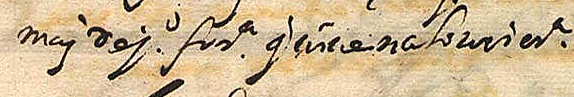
maj de j.o frr.a q̄ esta na Lourier.a
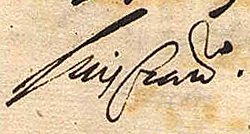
Luis fran.co
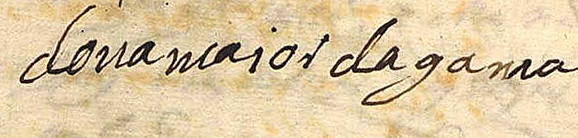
dona maior da gama
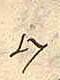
17
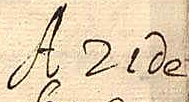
A 21 de
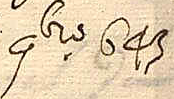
9.bro 643
